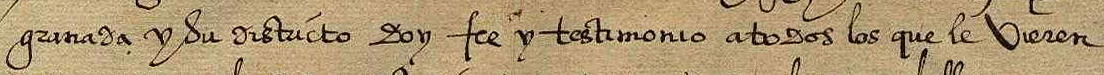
granada y su districto doy fee y testimonio a todos los que le Vieren
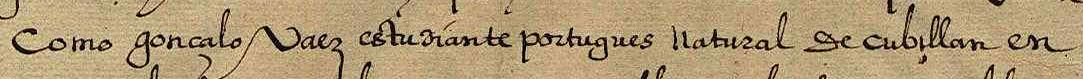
Como gonçalo Vaez estudiante portugues natural de cubillan en
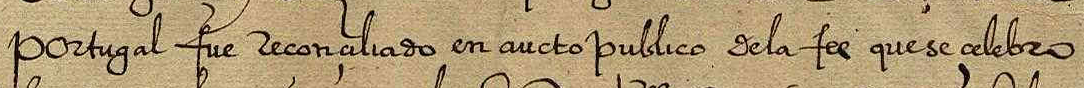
Portugal fue Reconciliado en aucto publico dela fee que se celebro
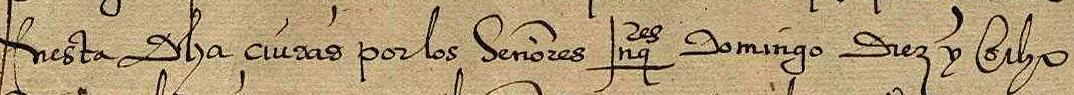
nesta Dha ciudad por os Sen̄ores Jnqres Domingo Diez y ocho
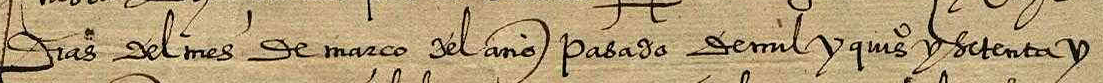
Dias del mes de março del an̄o pasado de mil y quiso y setenta y
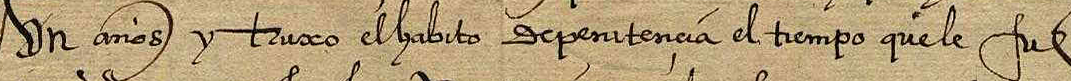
un an̄os e truxo el habito de penitencia el tiempo que le fue
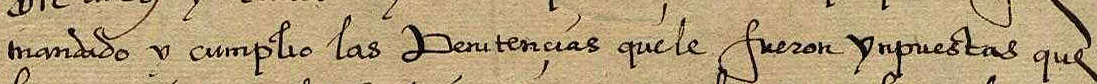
mandado y cumplio las penitencias que le fueron ynpuestas que
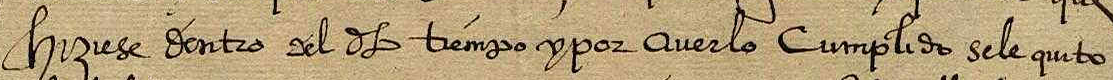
hiziese dentro del dho tiempo y por auerlo Cumplido se le quito
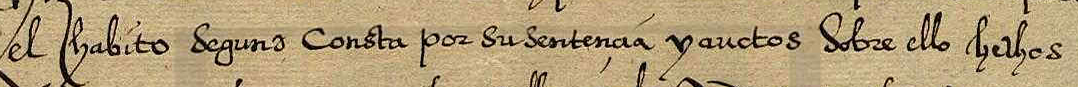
el habito segund consta por su sentencia y auctos Sobre ello hechos
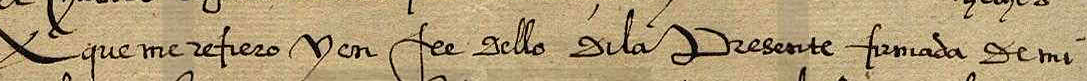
A que me refiero Y en fee dello di la presente firmada de mi
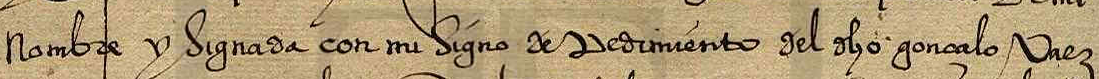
nombre y Signada con mi Signo de pedimiento del dho gonçalo Vaez
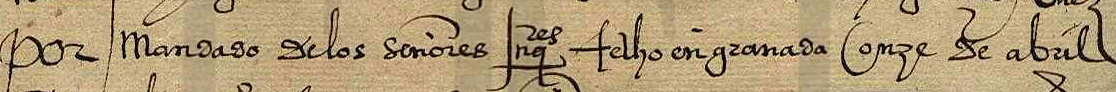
Por mandado de los senōres Jnqres fecho en granada onze de abril
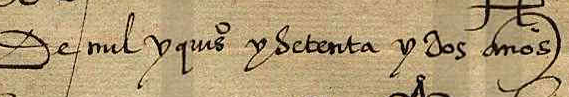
De mil y quiso y setenta y dos an̄os
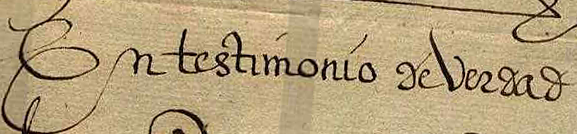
En testimonio de Verdad
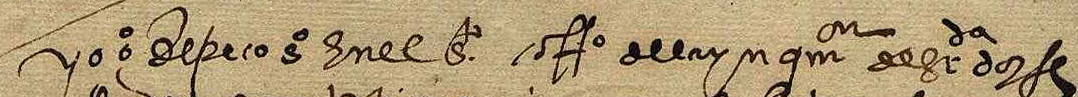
Yo go de peco so En el s.to offo dela ynquion de grda dos fe
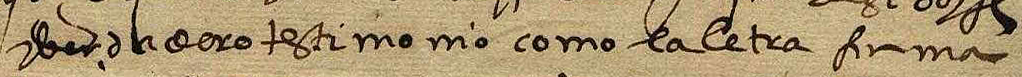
y verdadero testimonio como la letra firma
